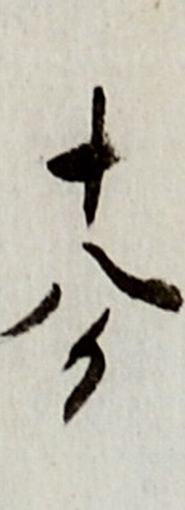十八日
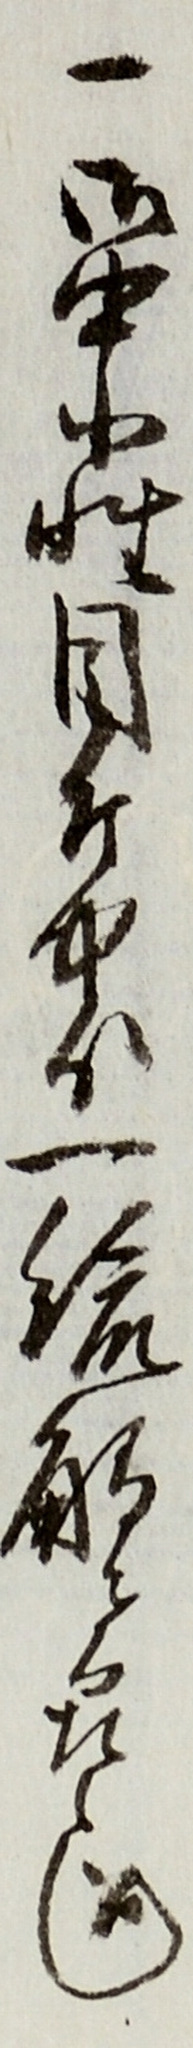一御中小性目付中ゟ一統触ニ而左之趣
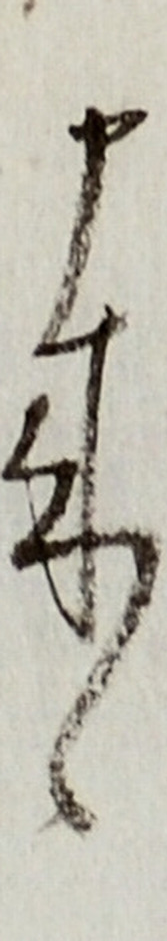申来候
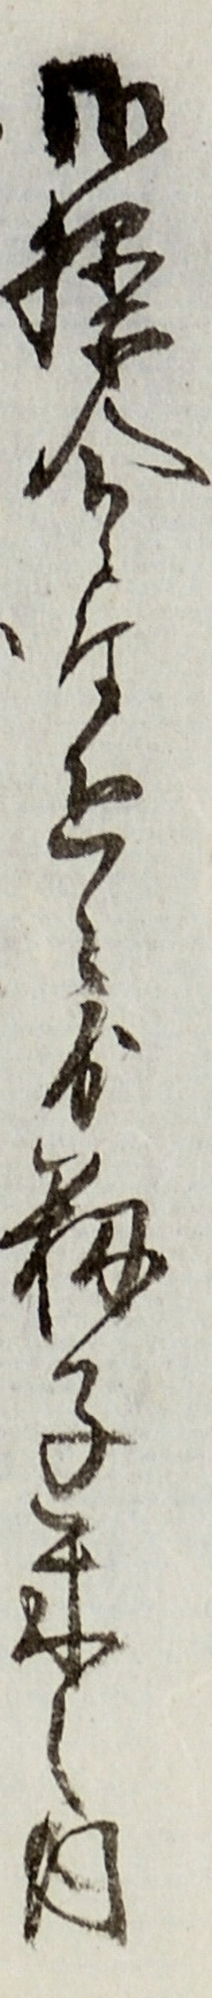御操合ニ付近々ゟ籾子米之内
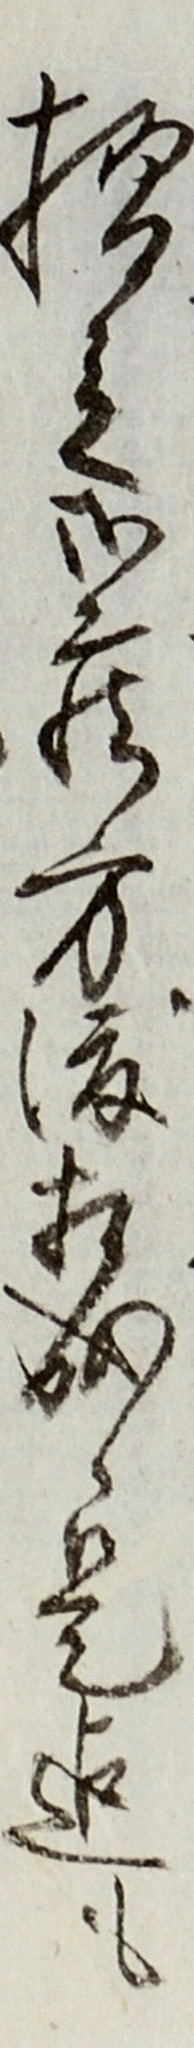摺立御蔵方渡相成候是迄も
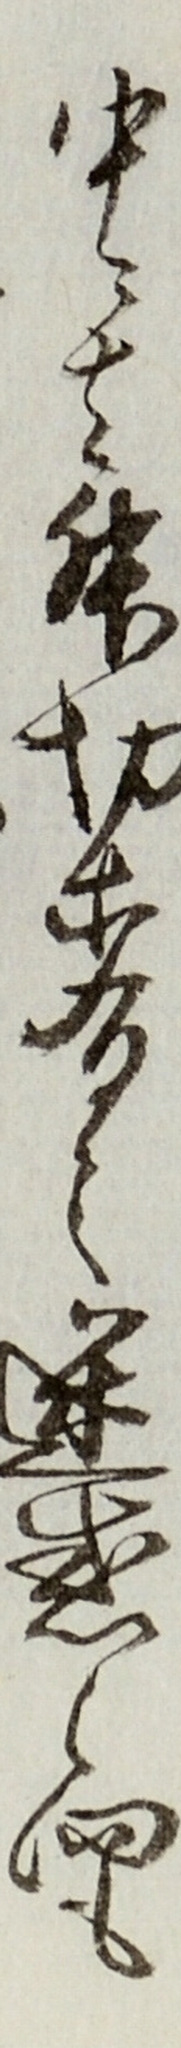中ニ者升切等有之迷惑之向も
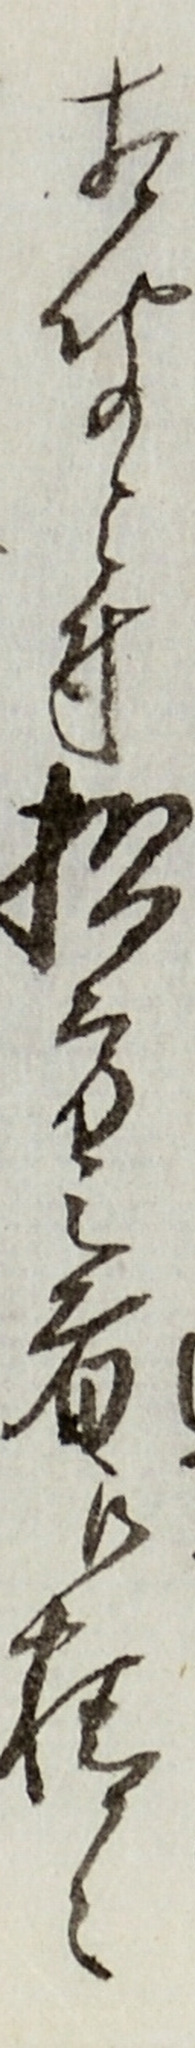相聞候ニ付摺方之者江精々
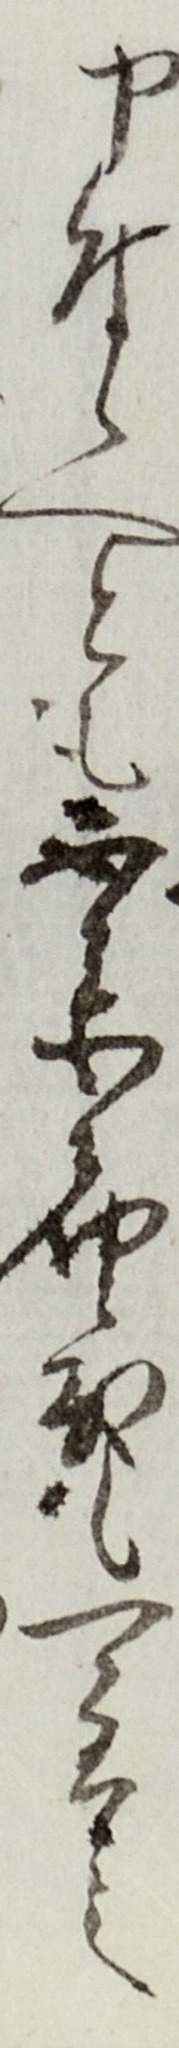申付候へとも不参届候義も可有之
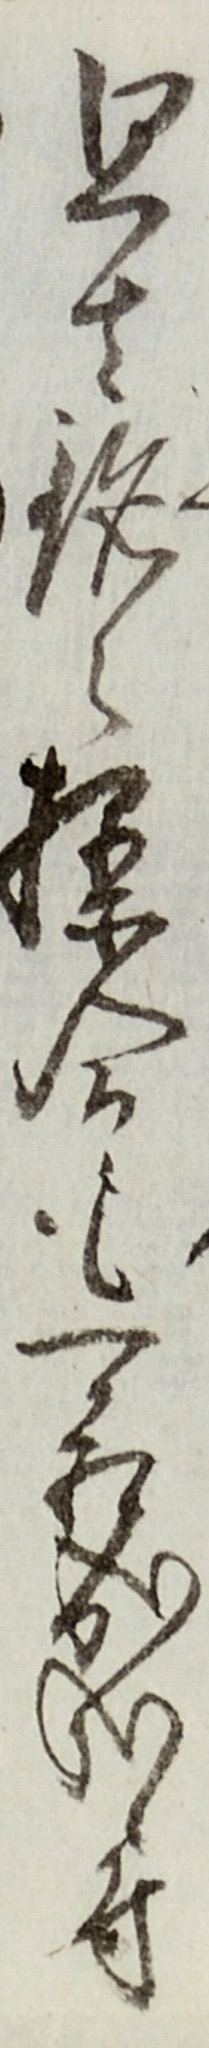且者銘々操合ニも可相成哉ニ付
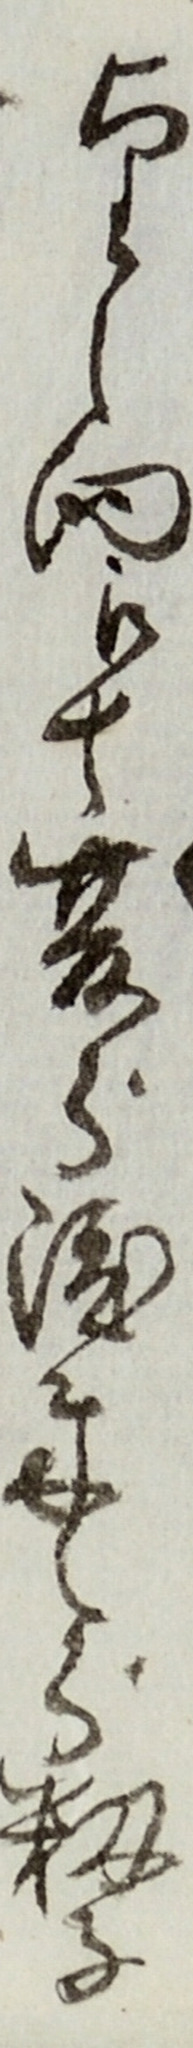望之向江者夏分渡米之分籾子
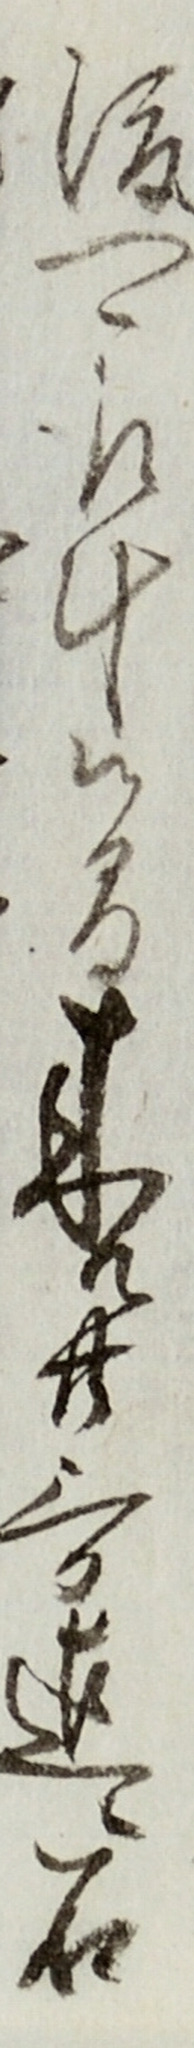渡可取計候間来ル廿三日迄ニ石
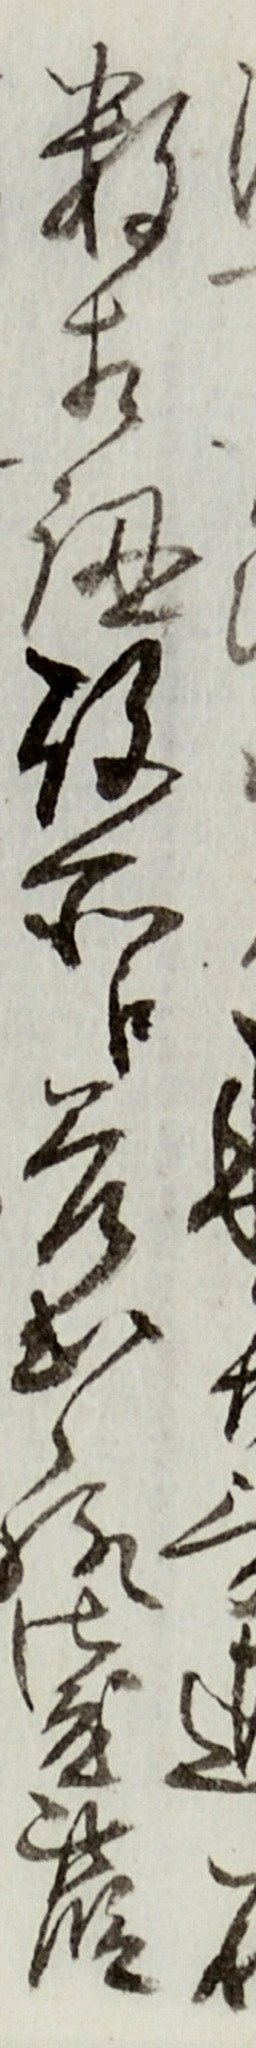数相認役所江差出候様仕度此段
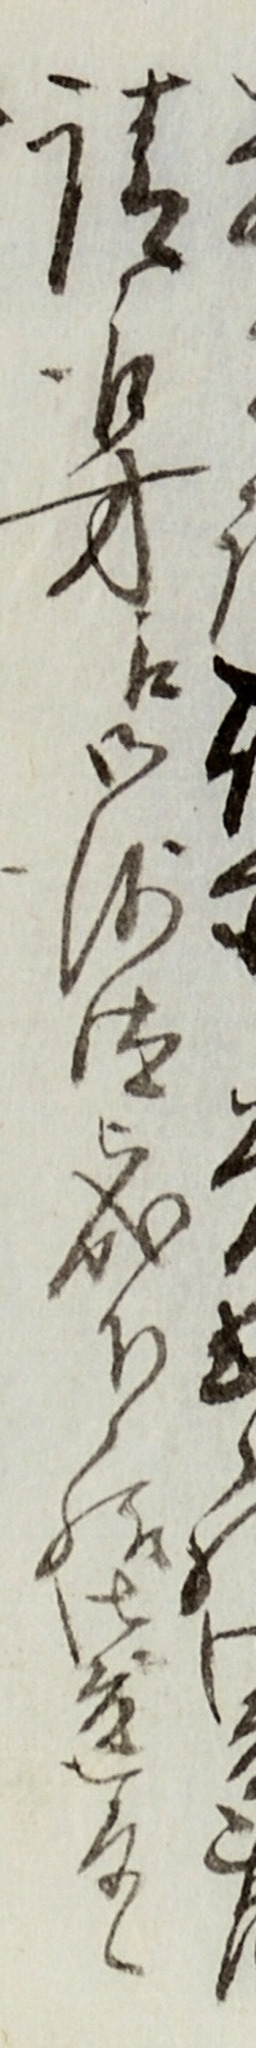請取方江御沙汰被成下候様仕度奉存候
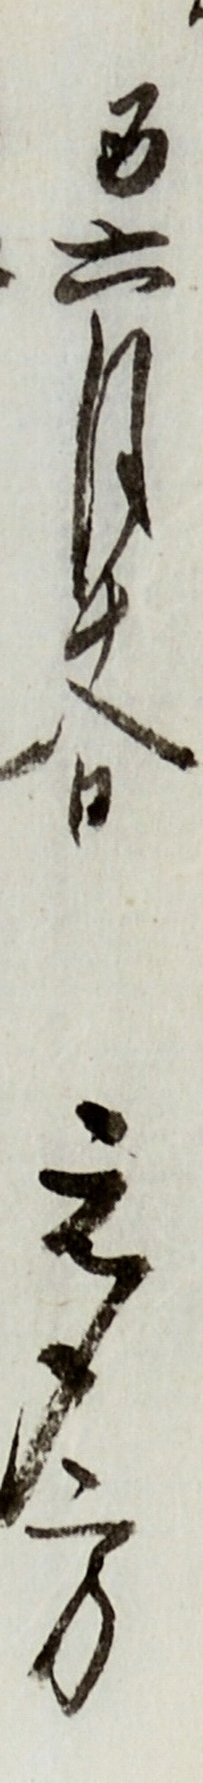酉六月十八日元〆方
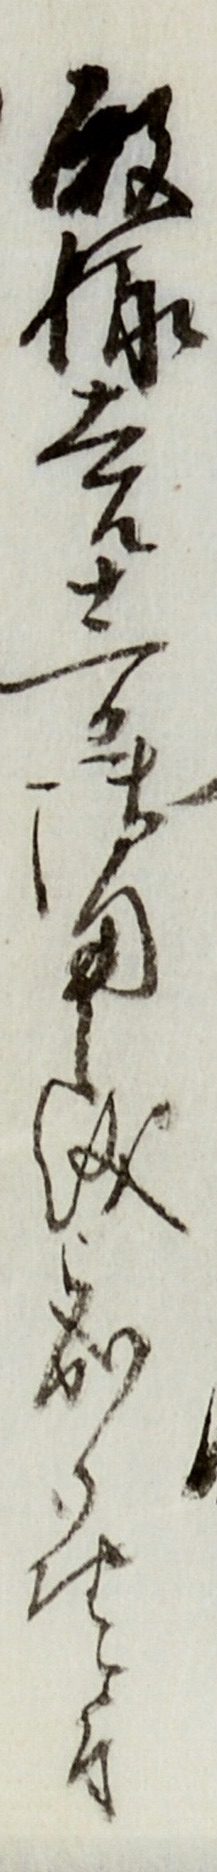殿様去ル十二日御用之儀被成御座候ニ付
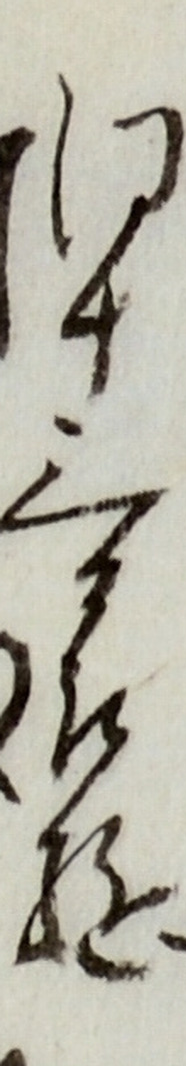同十三日被遊
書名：御山方御薪方諸事御用留
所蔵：伊那市立高遠町図書館・合同会社AMANE
